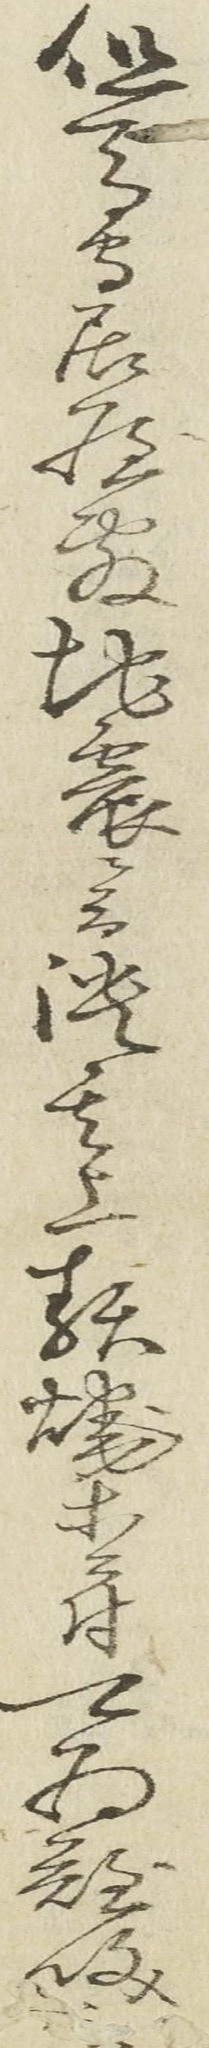但馬守居屋敷地震ニ而皆潰其上類焼等ニ付可為難儀と被
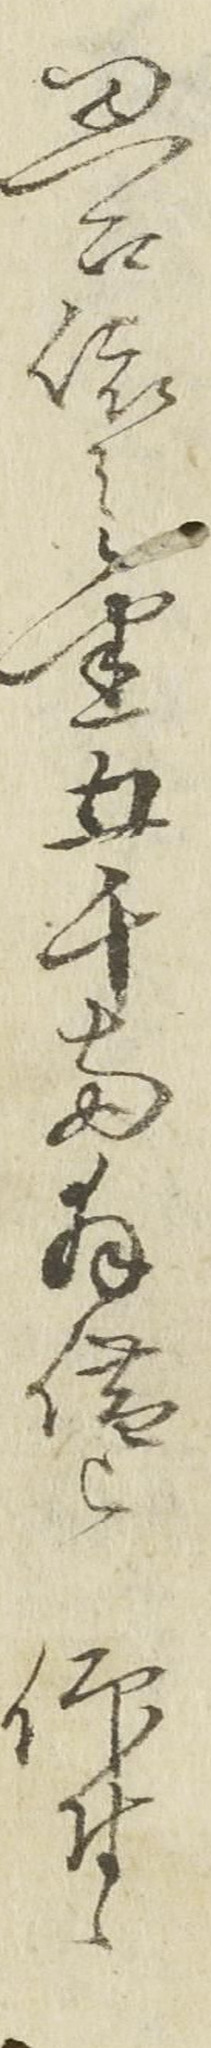思召依之金五千両拝借被仰付候
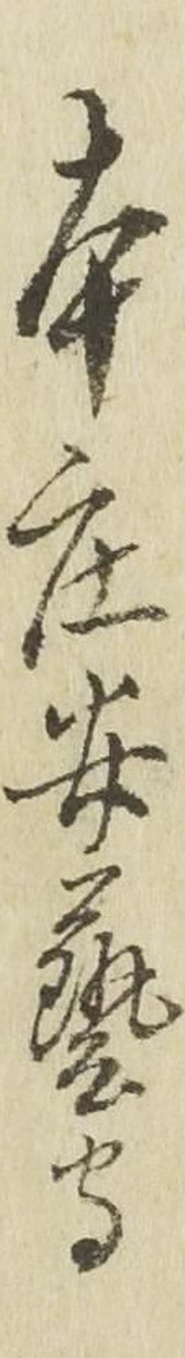本庄安芸守
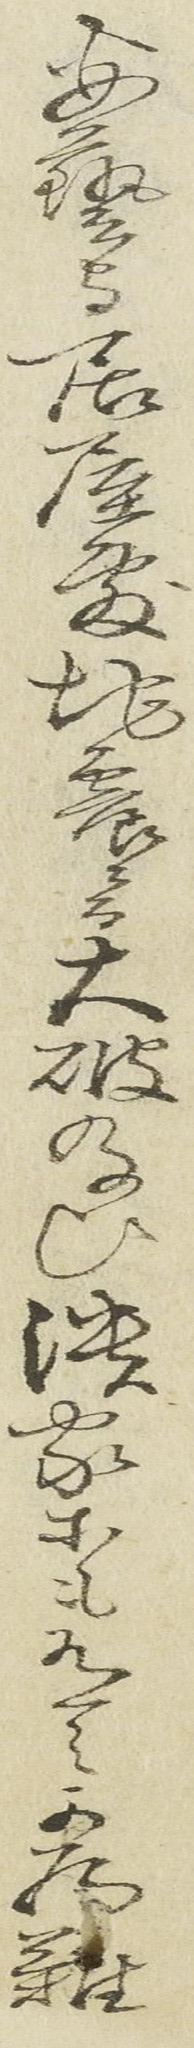安芸守居屋敷地震ニ而大破及び潰家等も有之可為難
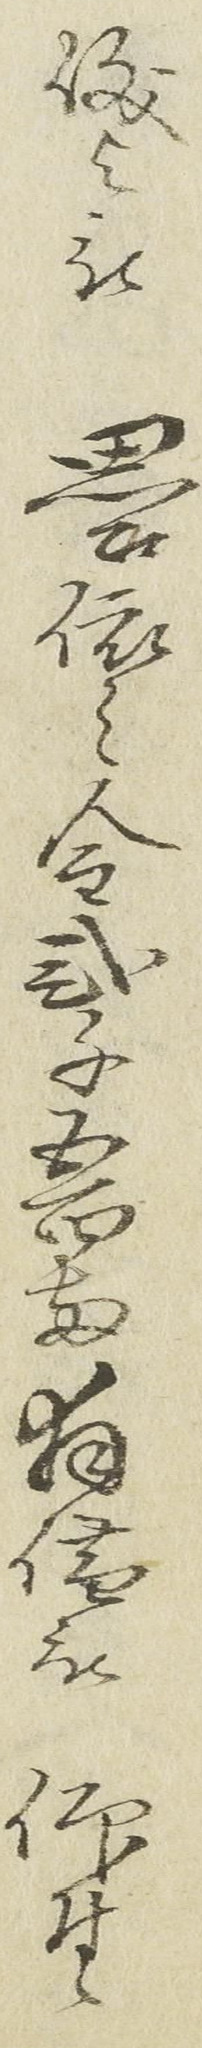儀と被思召依之金二千五百両拝借被仰付候
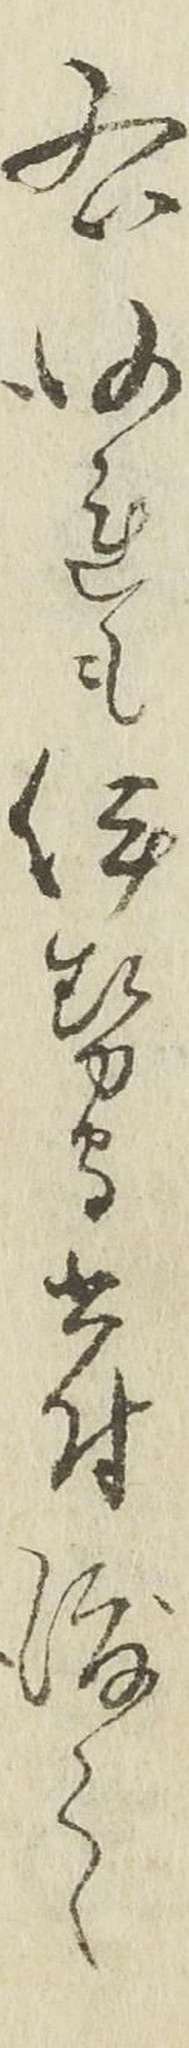右何れも伊勢守書付渡之
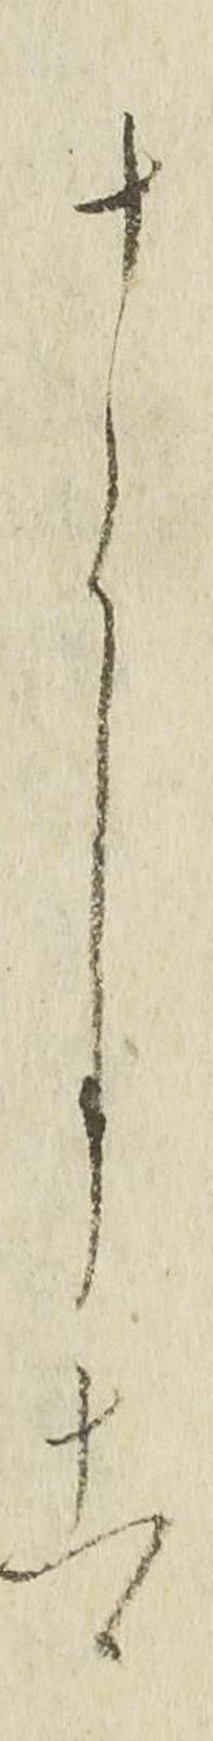十月十一日
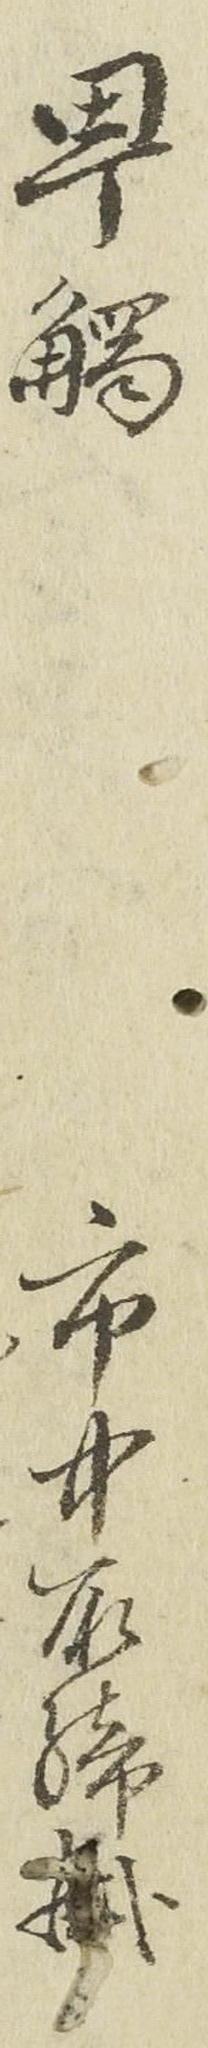早触市中取締掛
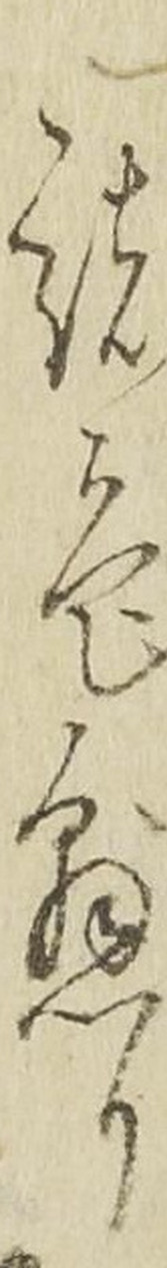諸色懸り
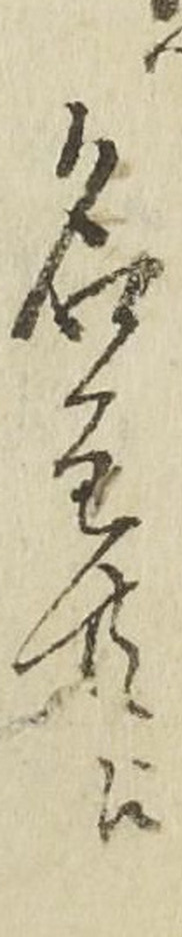名主共え

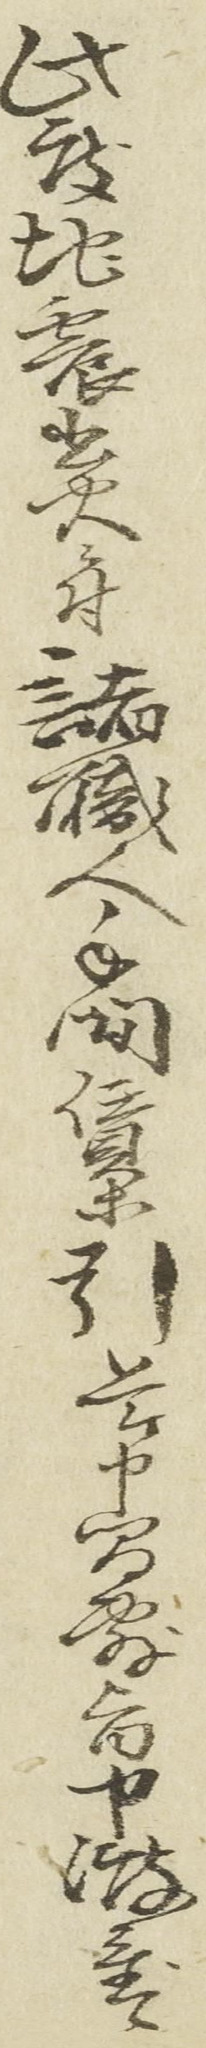此度地震出火ニ付諸職人手間賃等引上ケ申間敷旨申渡置候
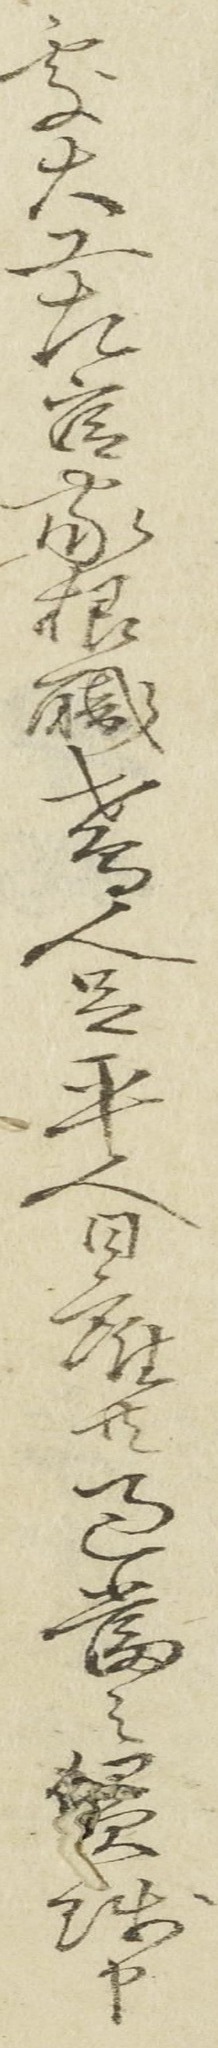処大工左官家根職鳶人足平人日雇共過当之賃銭申
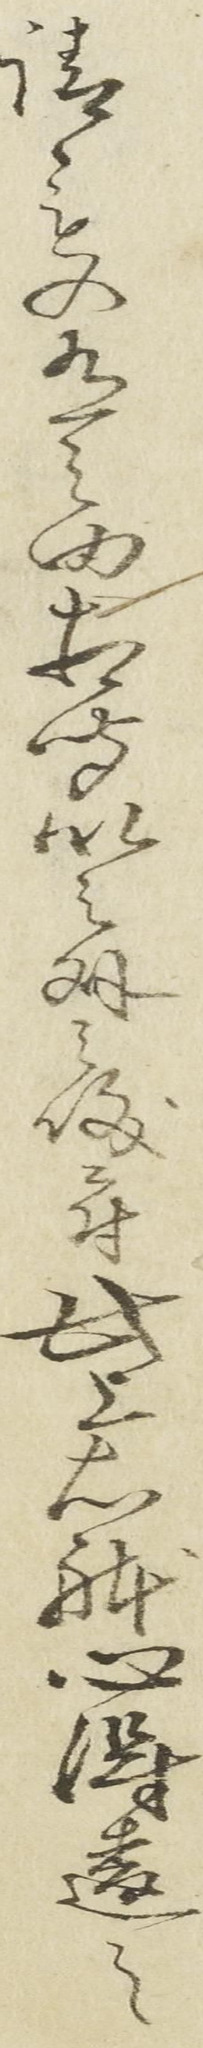請候もの有之由相聞以之外之儀ニ付此上右躰心得違之
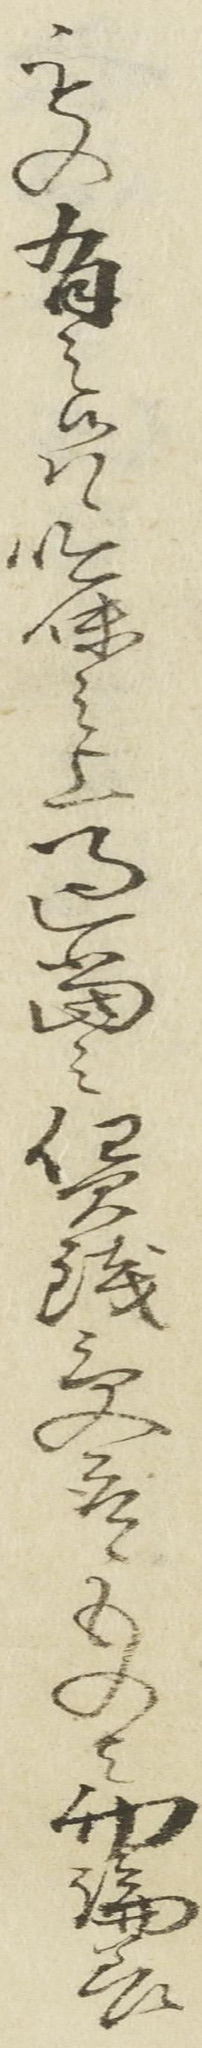もの有之候ハゝ吟味之上過当之賃銭受取候ものは勿論差
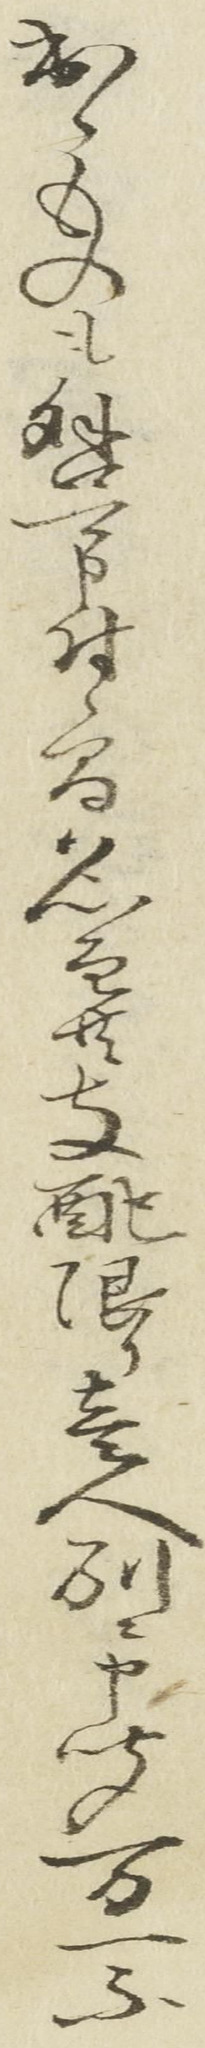出候ものも咎可申付候間名主共支配限り壱人別二申聞万一不
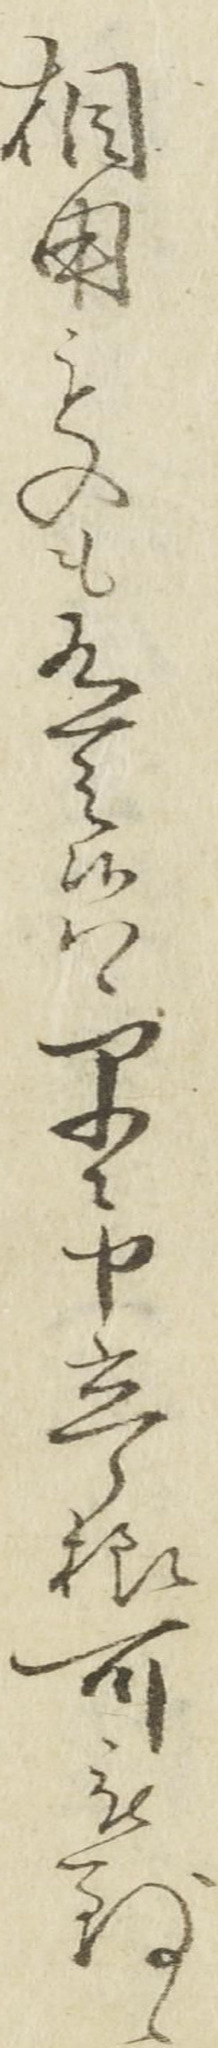相用ものも有之候ハゝ早々申立候様可被致候
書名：安政二乙卯年十月二日大地震之事
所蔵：東京大学地震研究所図書室 Earthquake Research Institute Library, The University of Tokyo, JAPAN
